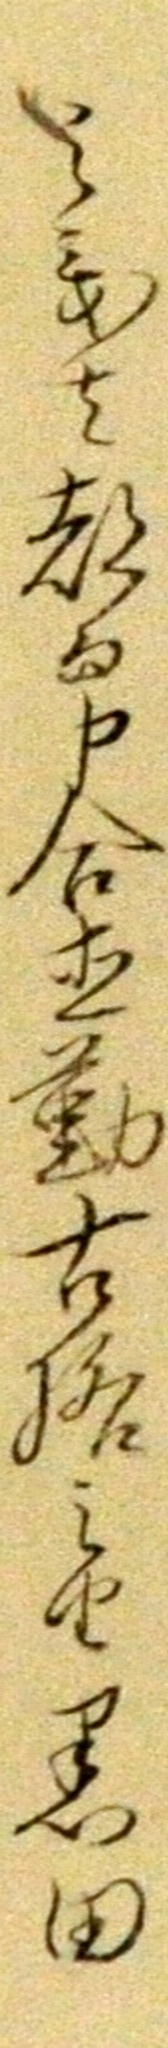之義者都而申合直勤古格之由黒田
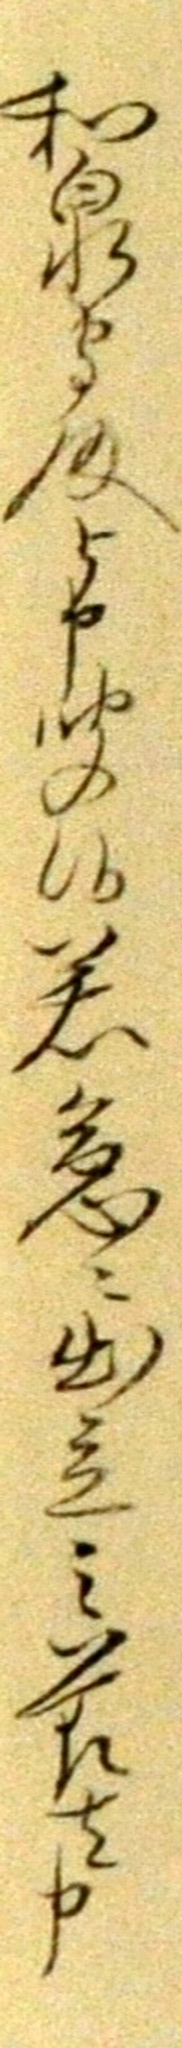和泉守殿被申聞候若急ニ出立之節者申

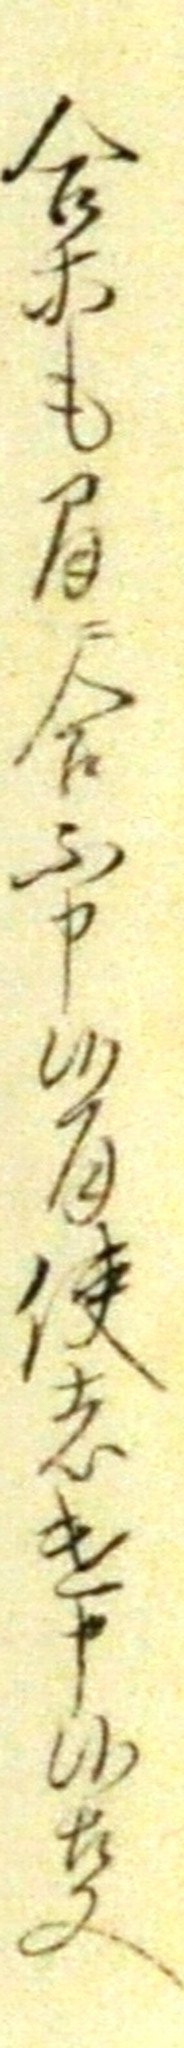合等も間ニ合不申候間使者遣申候事
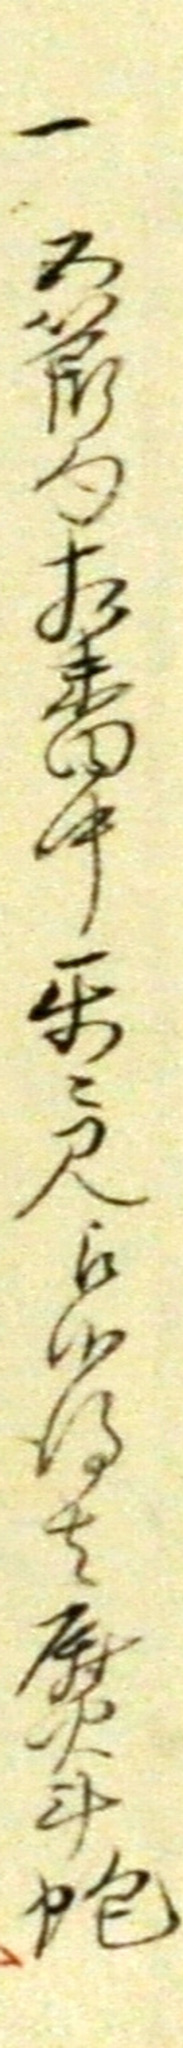一五節句相番中楽ニ見え候得は熨斗蚫
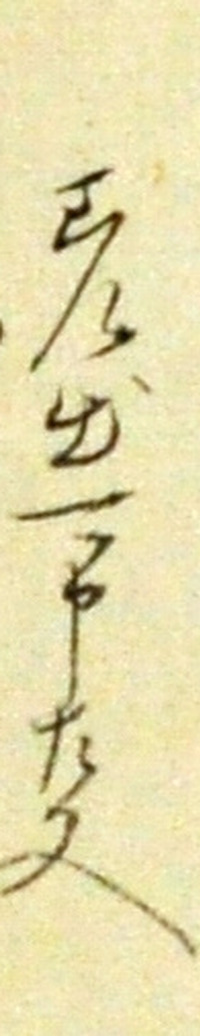差出可申事
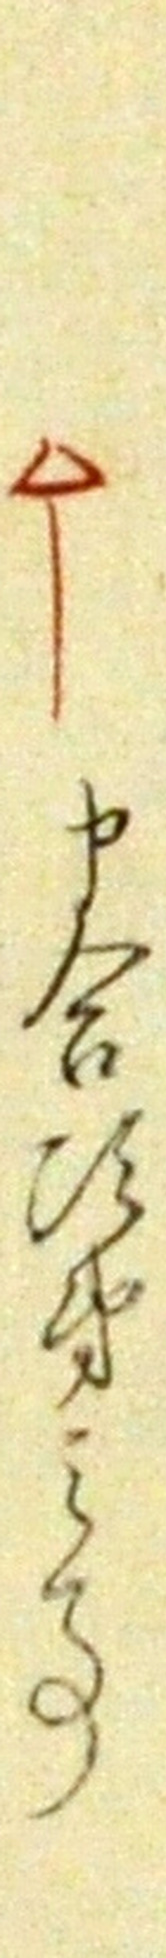申合次第之事
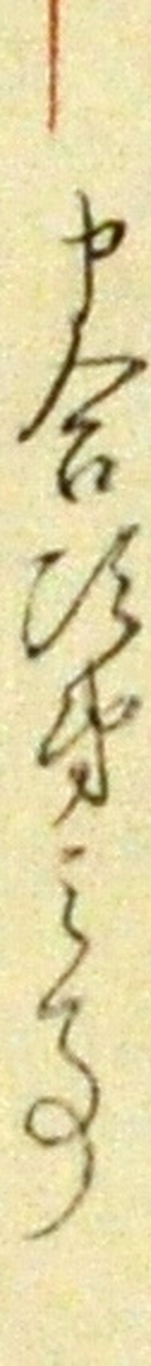申合次第之事
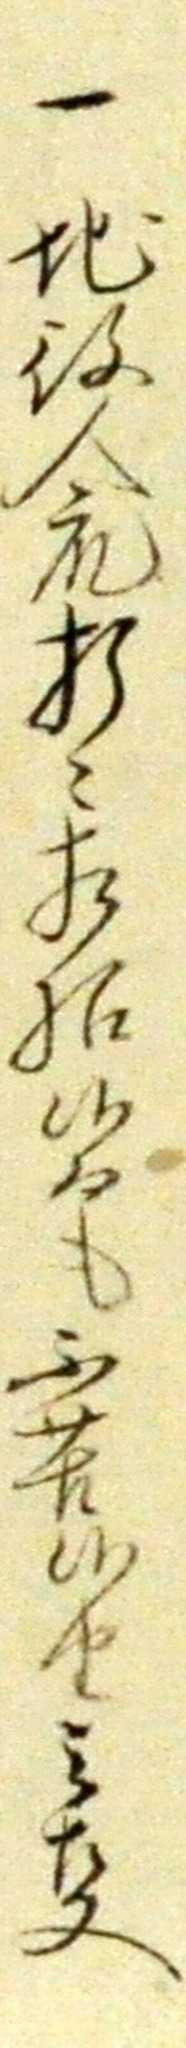一地役人衆折々相招候而も不苦候由之事
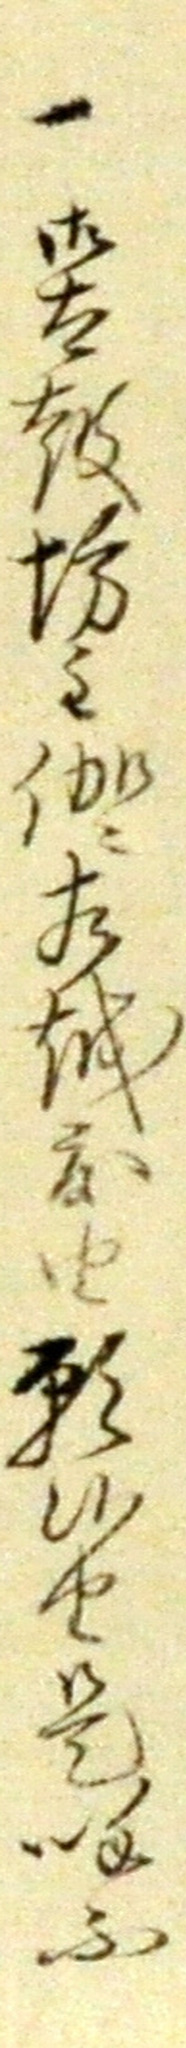一御太鼓坊主伽ニ相越度由願候由是呼不
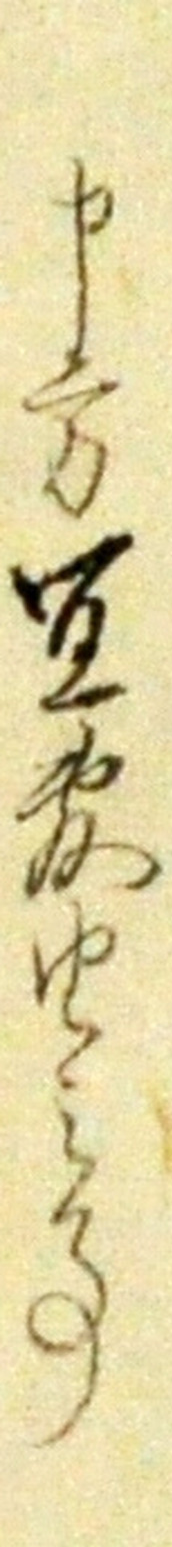申方宜敷由之事
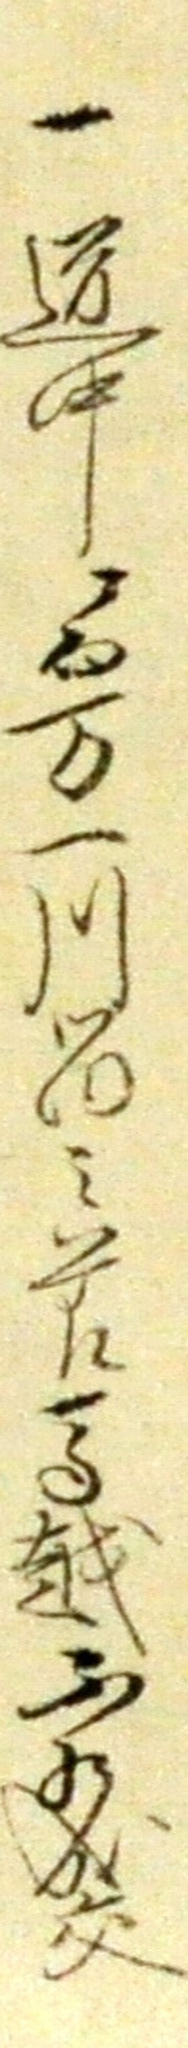一道中ニ而万一川留之節馬越不相成交
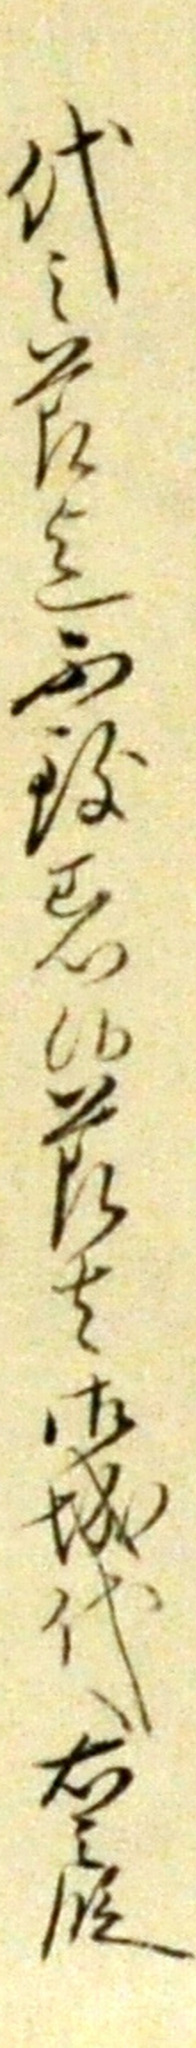代之節迄不致着候節は御城代へ右之段
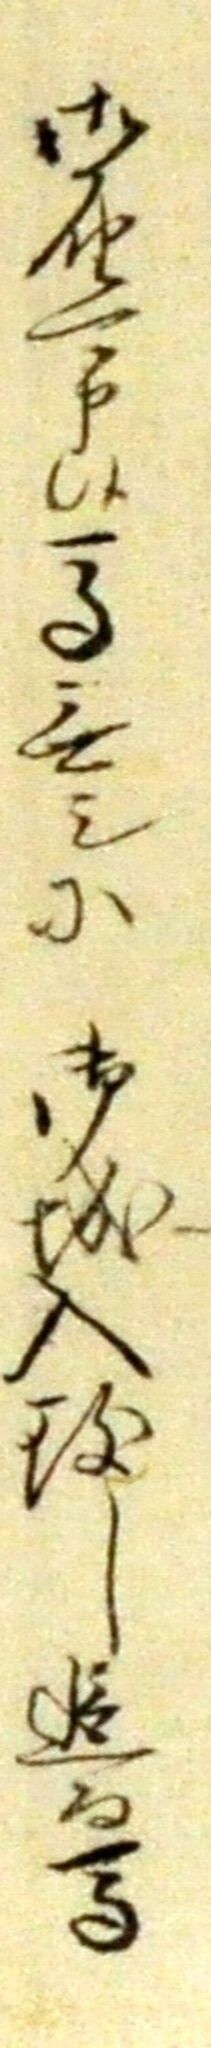御届可申候馬無シに御城入致し追而馬
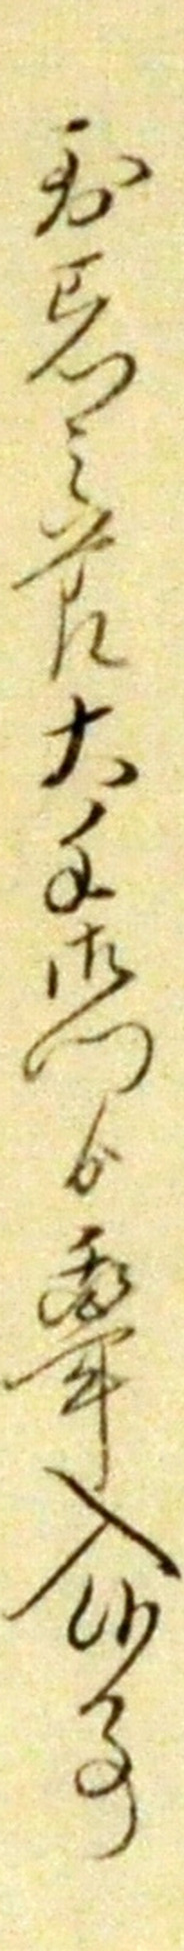到着之節大手御門ゟ牽入候事
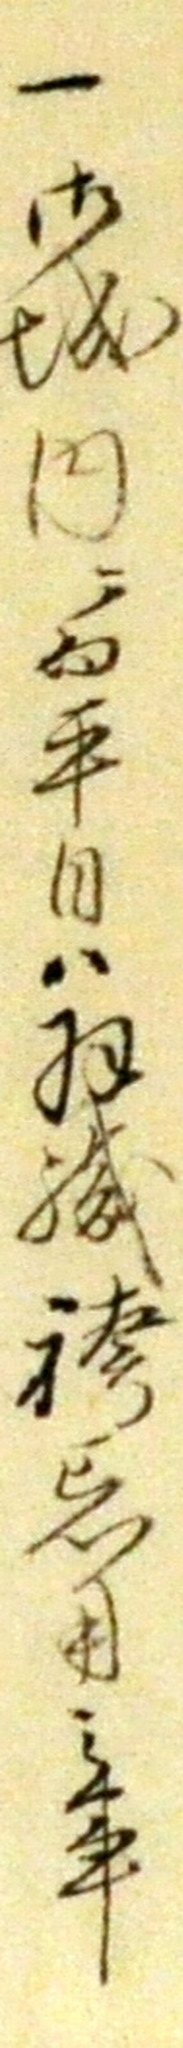一御城内ニ而平日は羽織袴着用之事
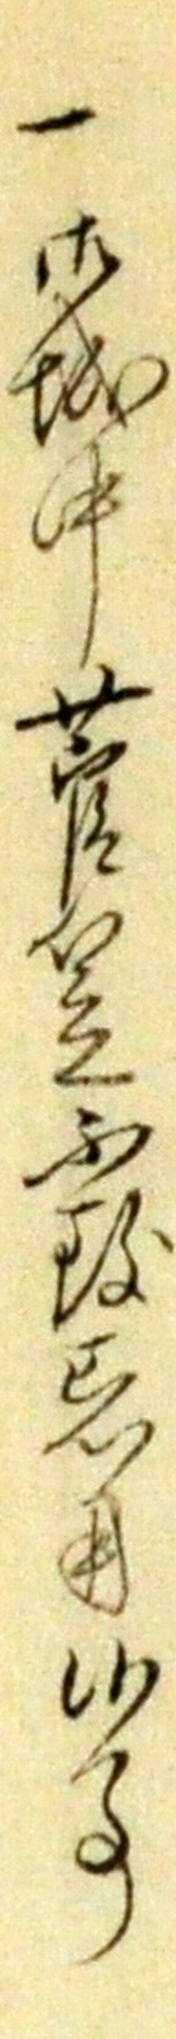一御城中菅笠不致着用候事
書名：大阪加番関係諸書留〔一括〕
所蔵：伊那市立高遠町図書館・合同会社AMANE
